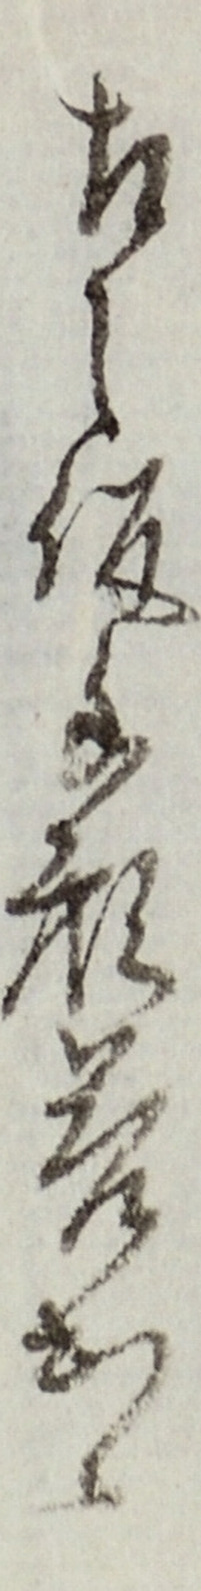左之仮手形差出候
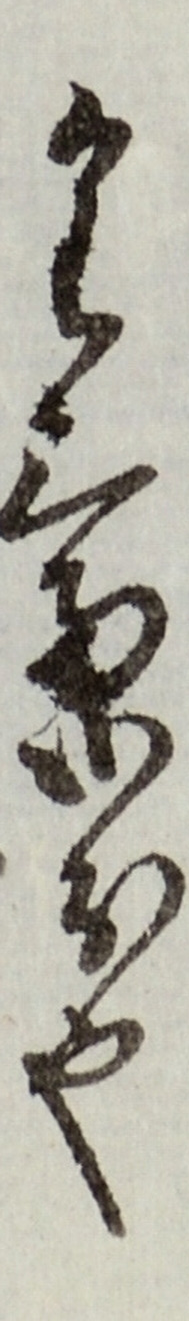金三両弐分也
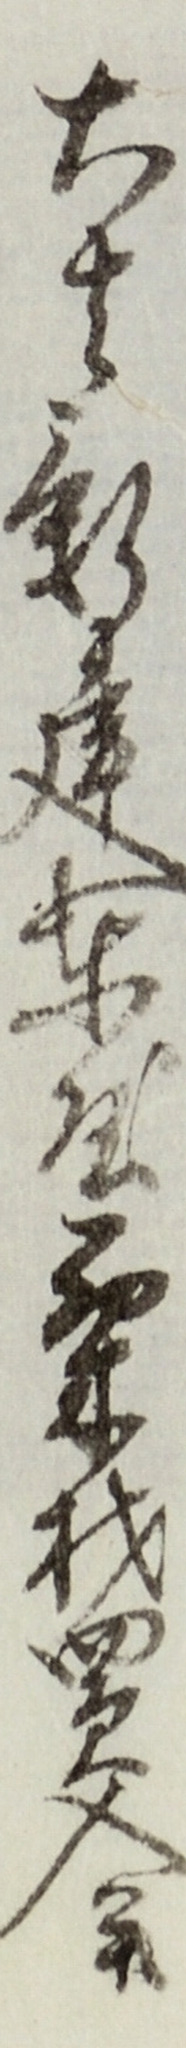右者新建車屋栗材買入幷
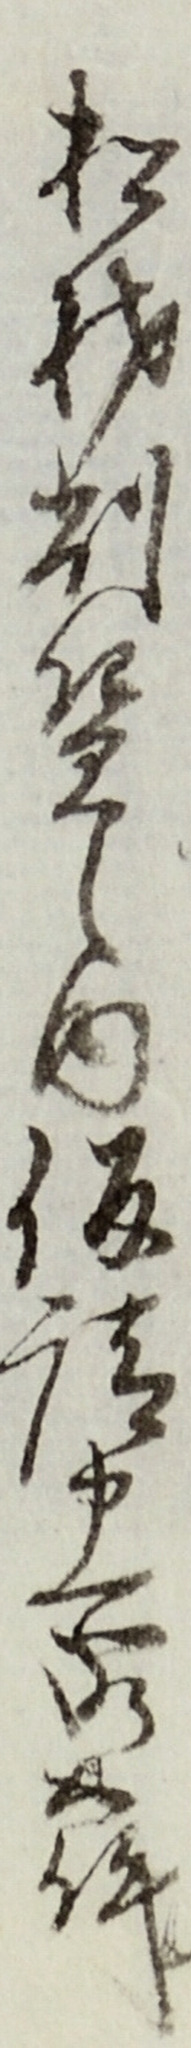松材削賃之内仮請申所如件
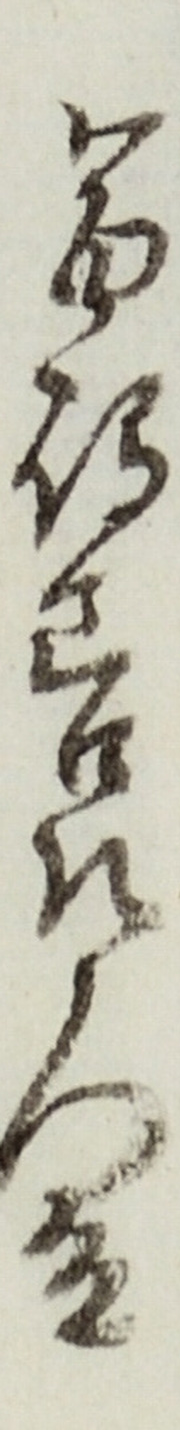冨嶋善左衛門殿
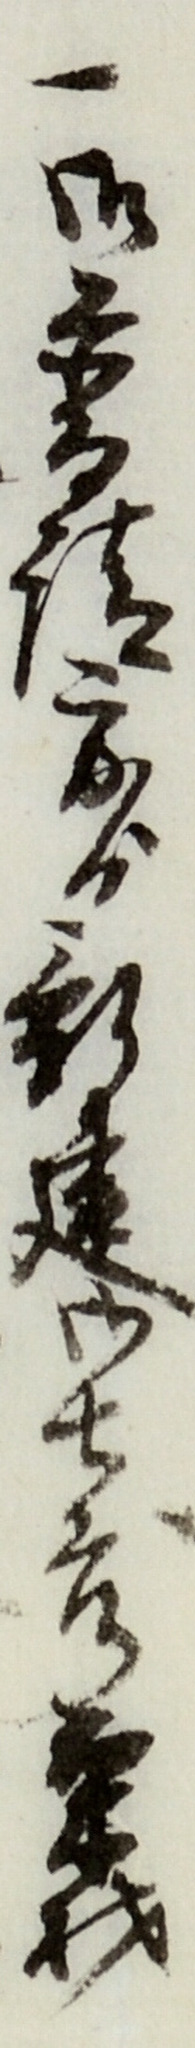一御普請方ゟ新建御土蔵栗材
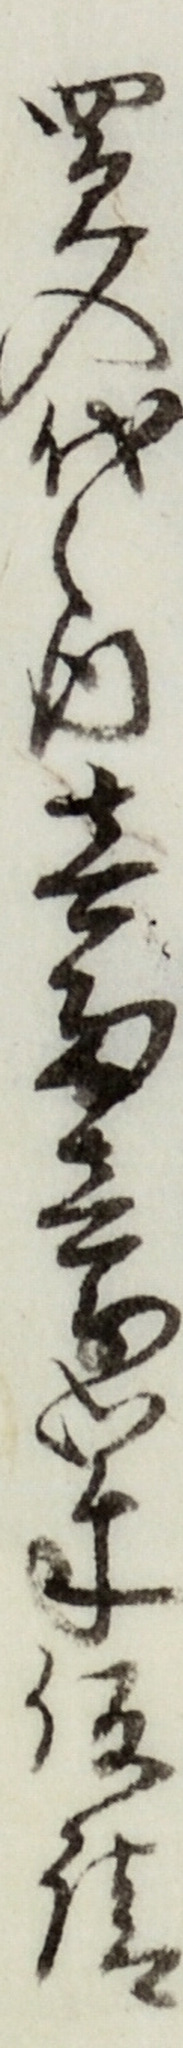買入代之内壱両壱分弐朱仮請

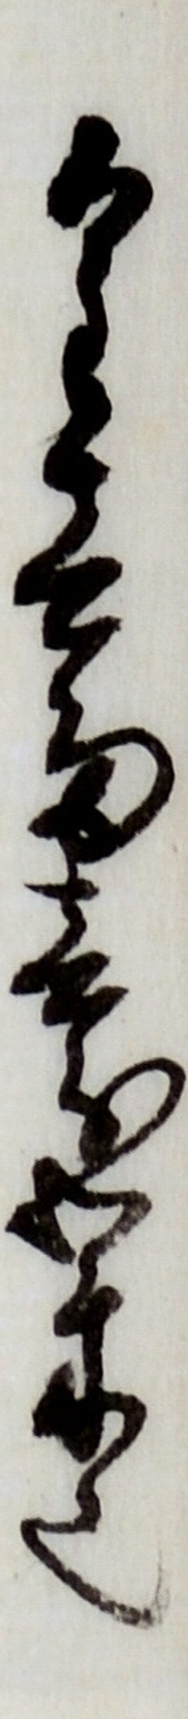金壱両壱分弐朱也
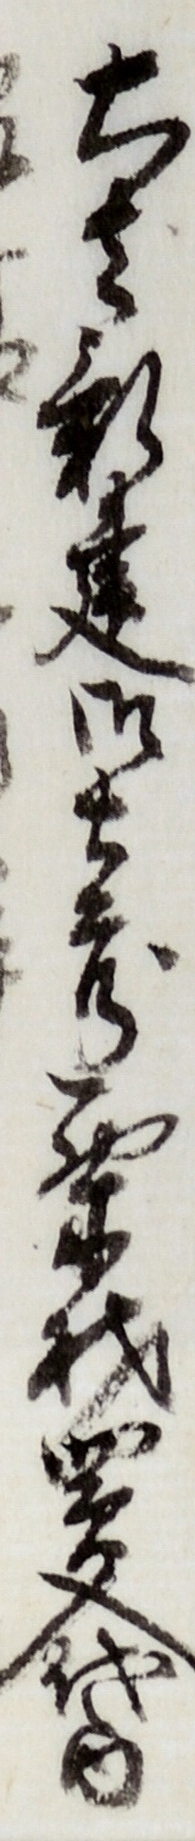右者新建御土蔵栗材買入代之内
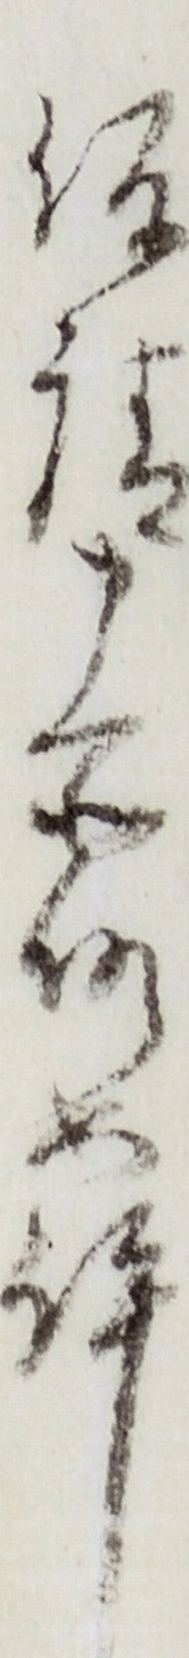仮請申所仍如件
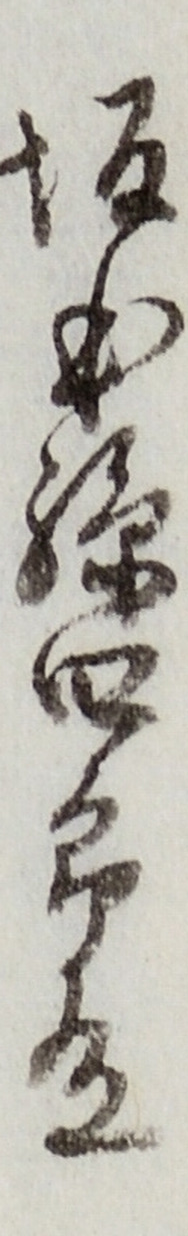坂本孫四郎殿
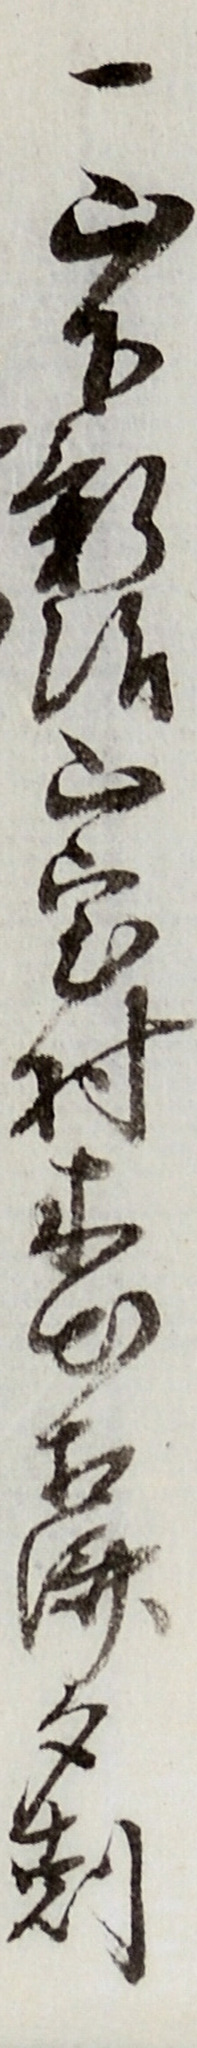一山下新治山室村木出相済夕刻
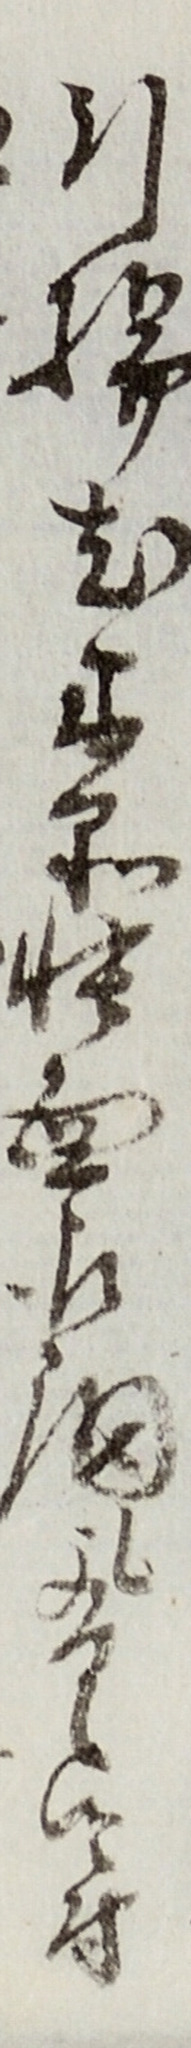引揚尤木品帳面取調も有之候ニ付
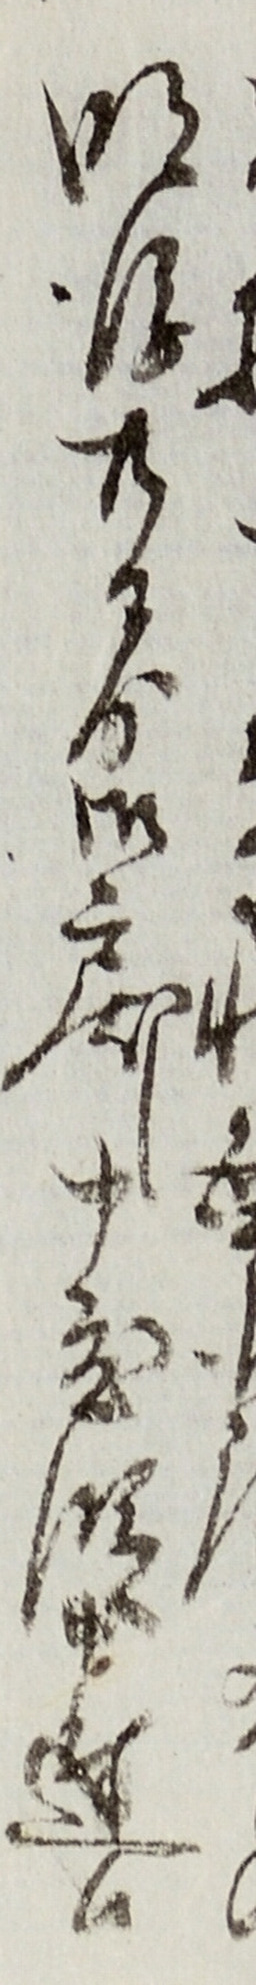明後廿日ゟ御戻し申度段申達候
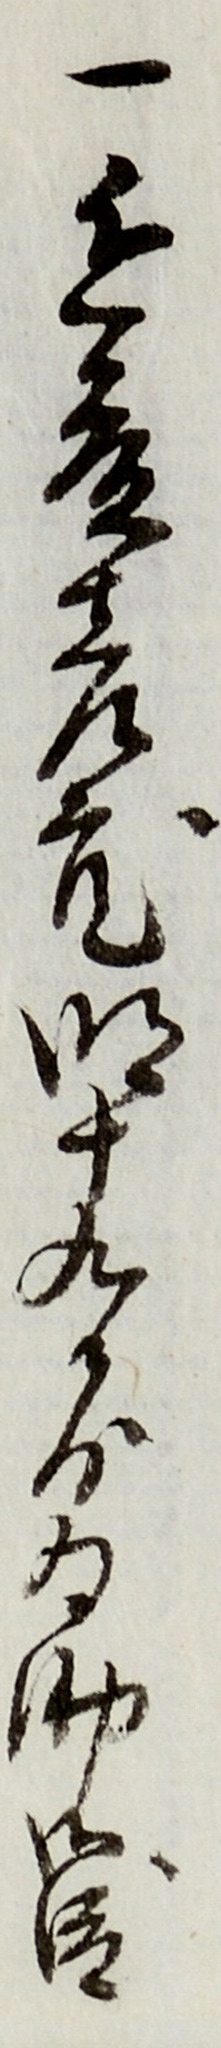一近藤彦蔵明十九日ゟ為助御渡
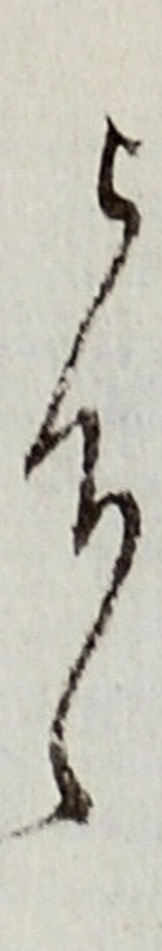被下候
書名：御山方御薪方諸事御用留
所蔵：伊那市立高遠町図書館・合同会社AMANE
